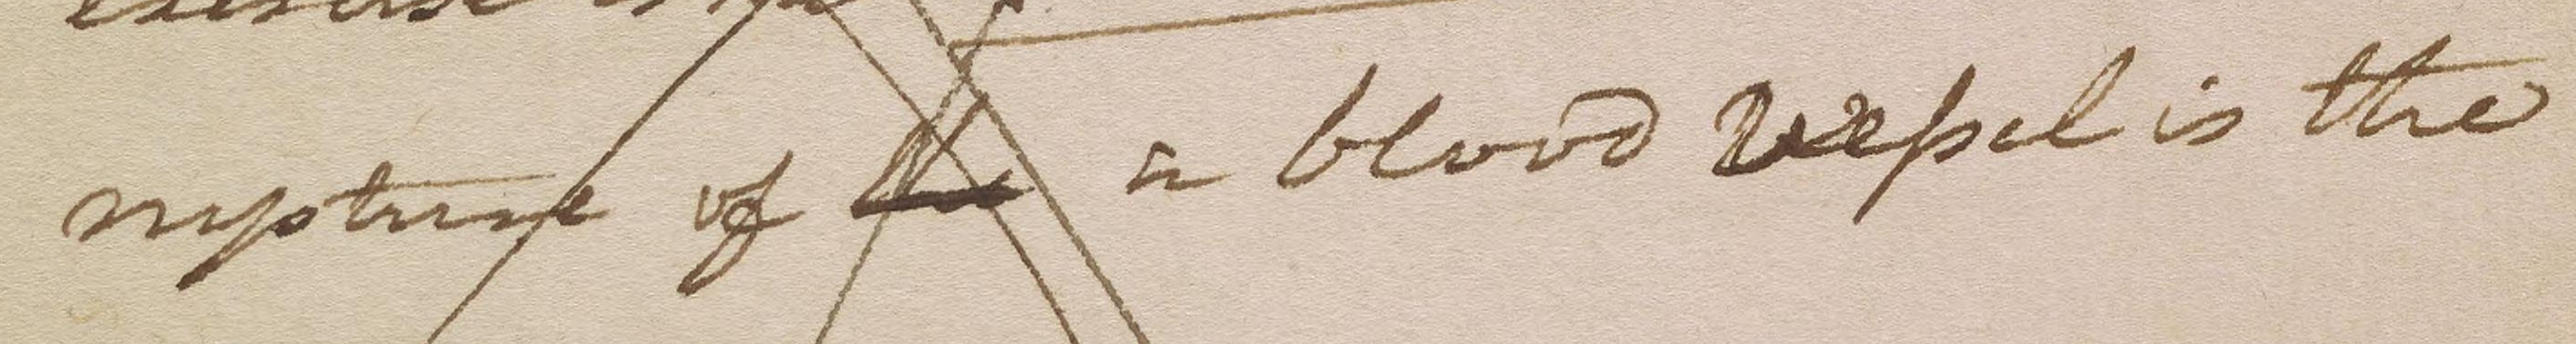rupture of [the] a blood vessel is the
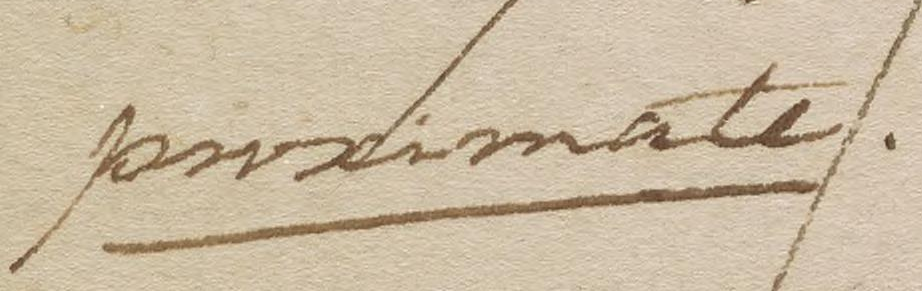proximate.
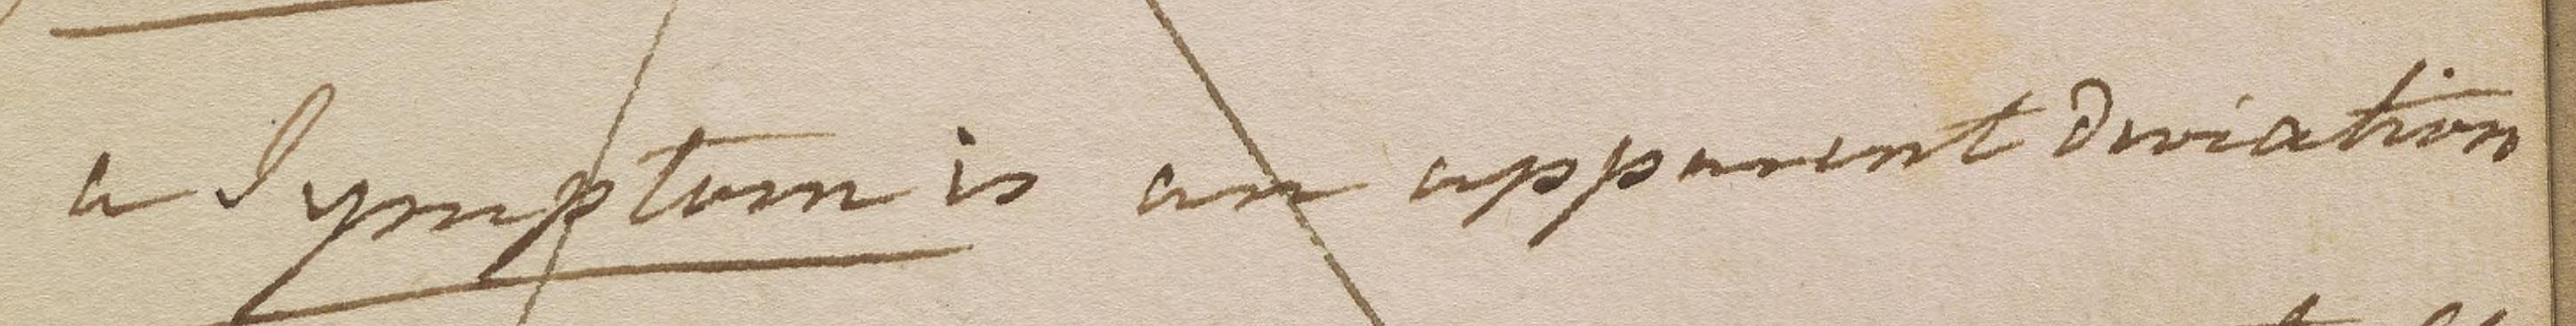Symptom is an apparent deviation
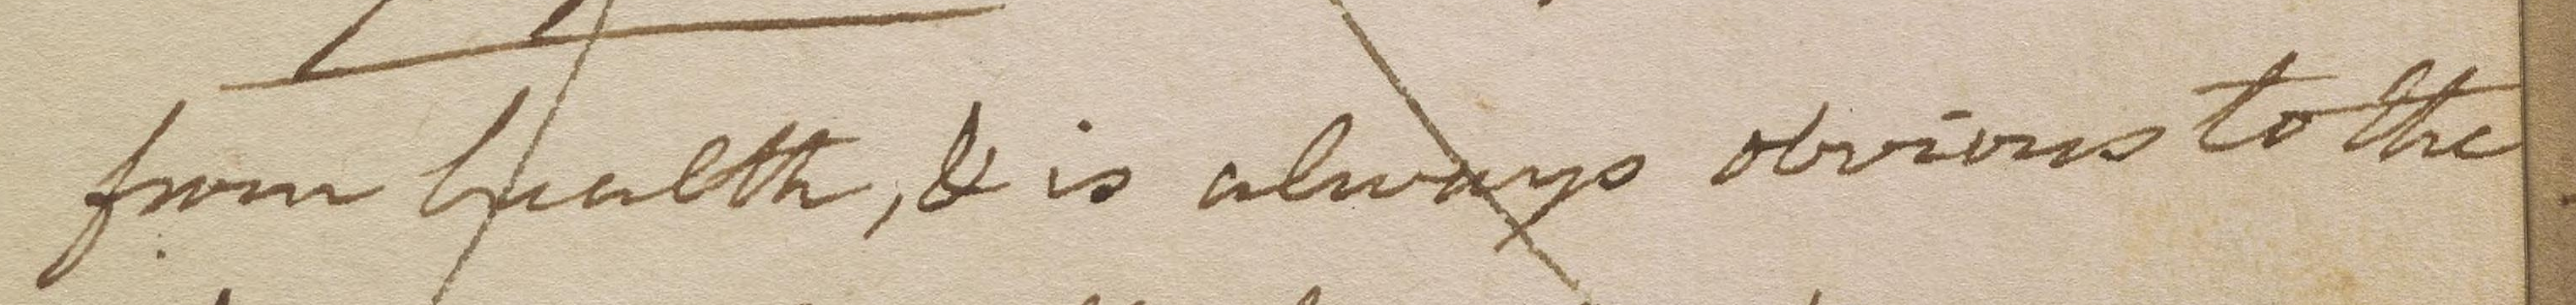from health, & is always obvious to the
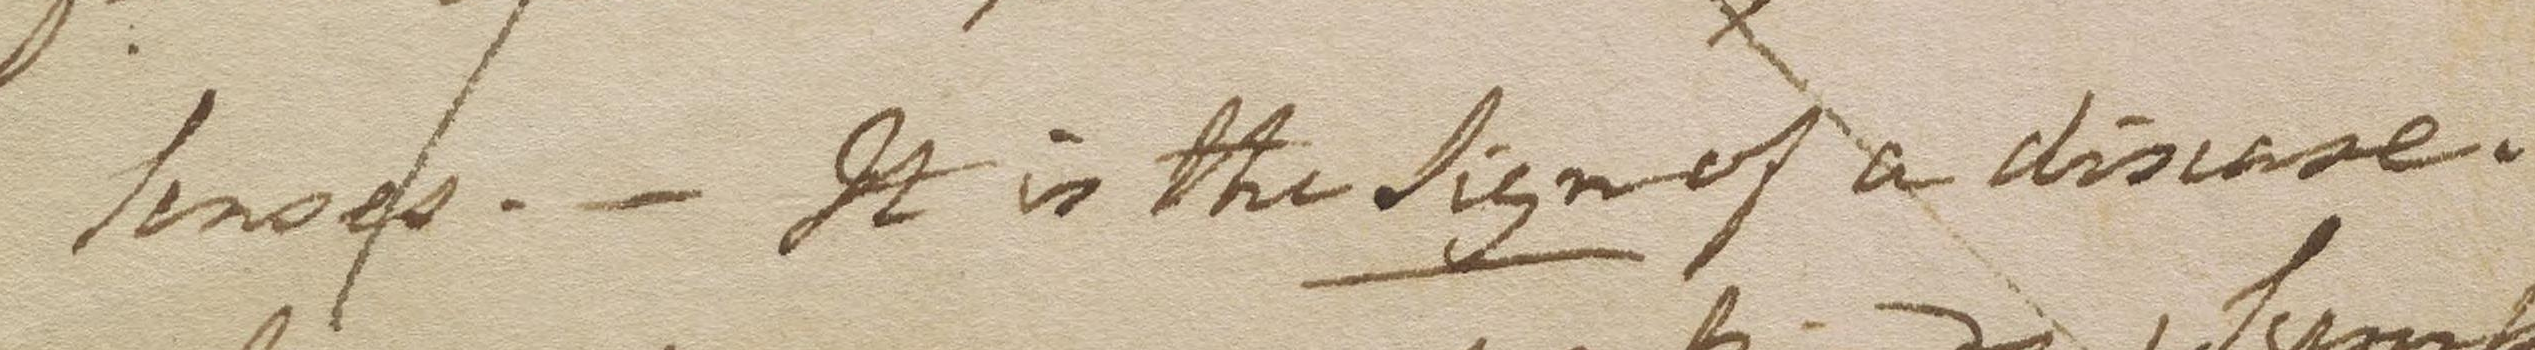senses. It is the sign of a disease.
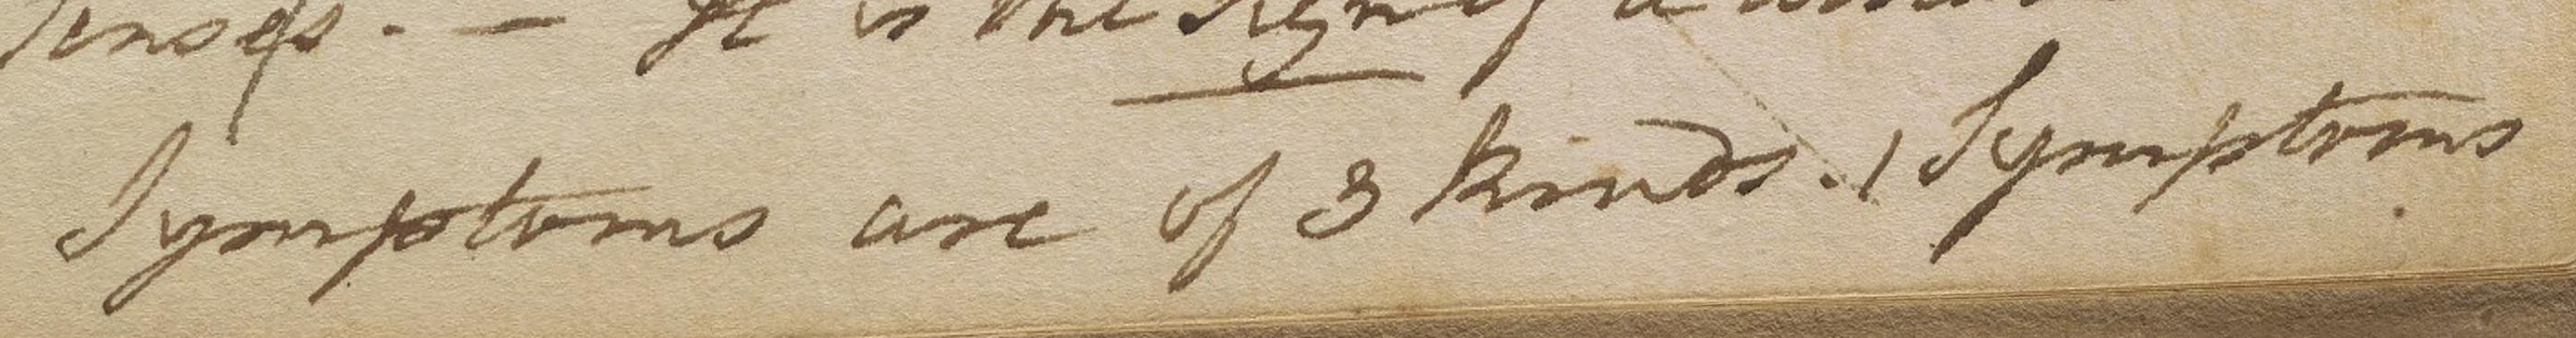Symptoms are of 3 kinds. Symptoms
